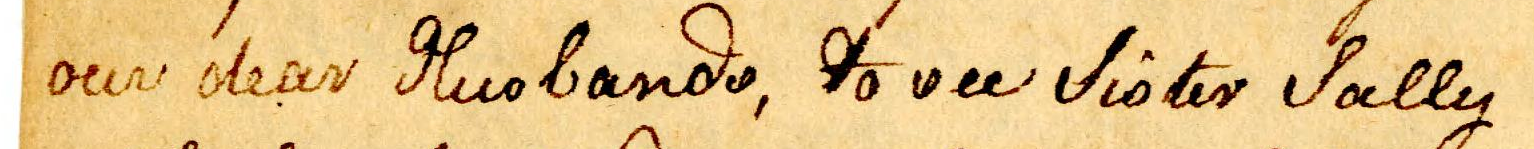our dear Husbands, to see Sister Sally
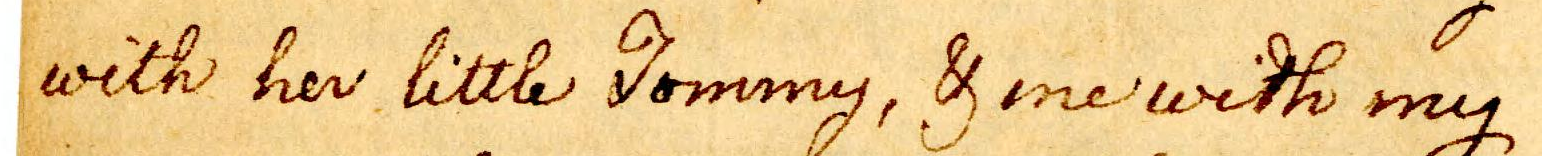with her little Tommy, & me with my
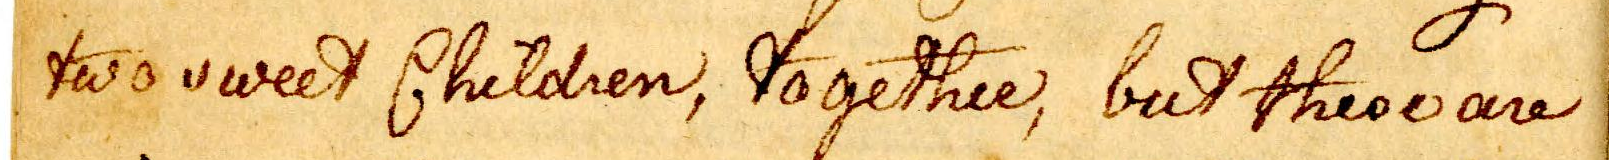two sweet Children, together, but these are
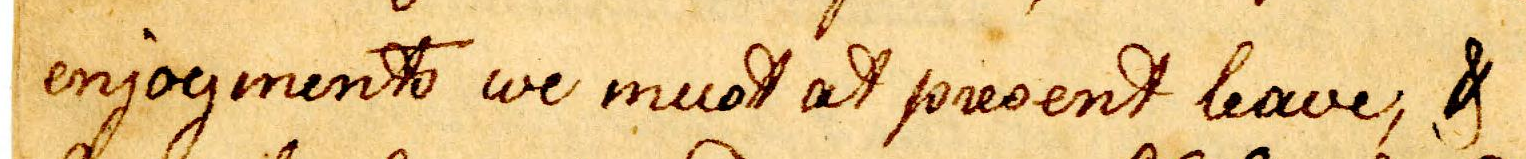enjoyments we must at present leave, &
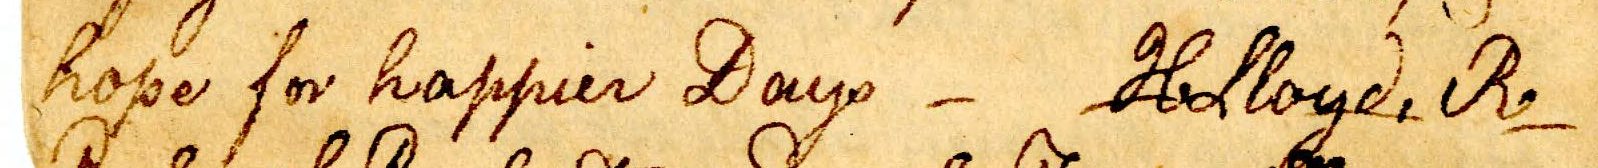hope for happier Days- H Lloyd, R-
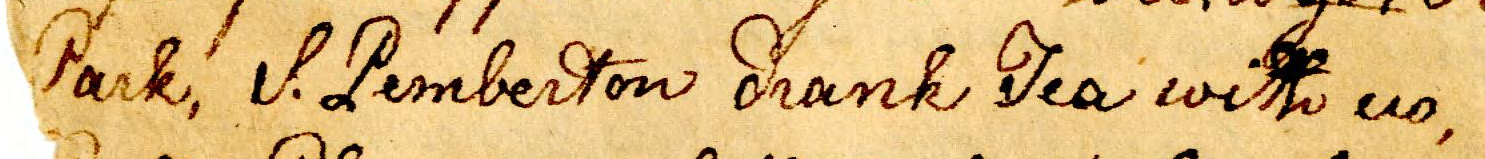Park, S. Pemberton drank Tea with us,
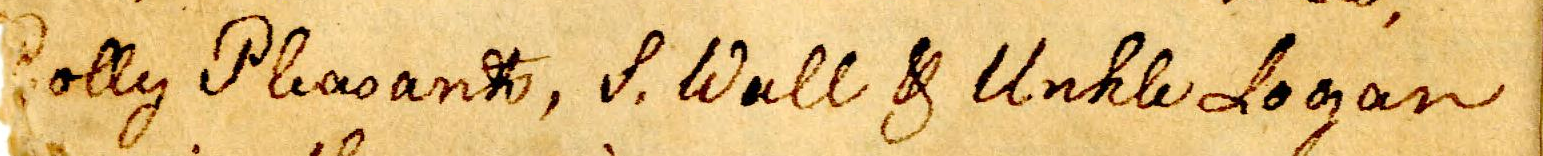olly Pleasants, S. Wall & Unkle Logan
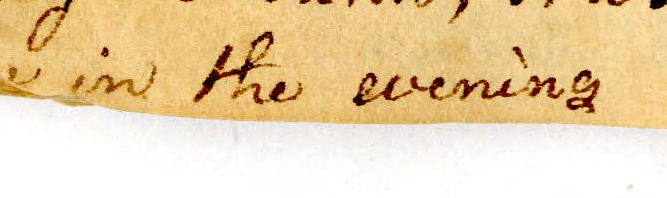in the evening
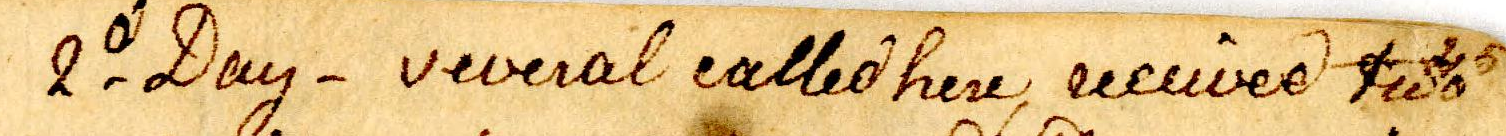2^d Day- several called here received two
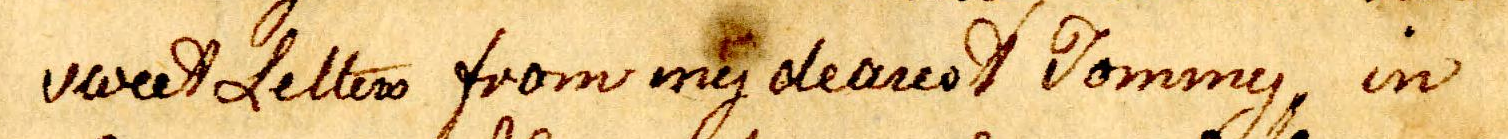sweet Letters from my dearest Tommy, in
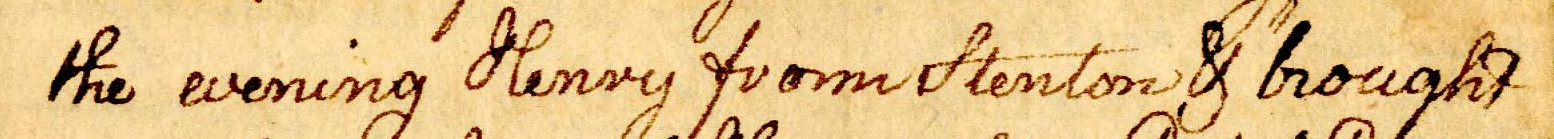the evening Henry from Stenton & brought
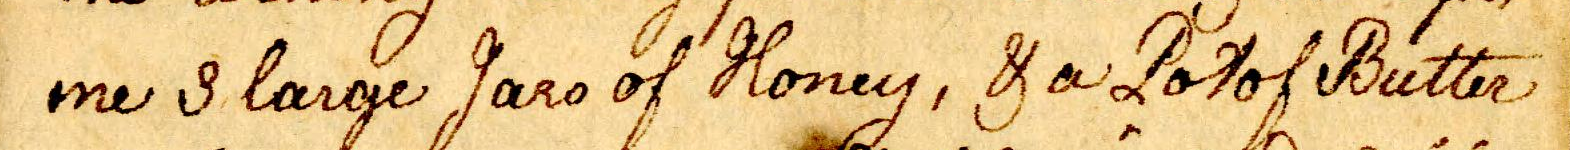me 3 large Jars of Honey, & a Pot of Butter
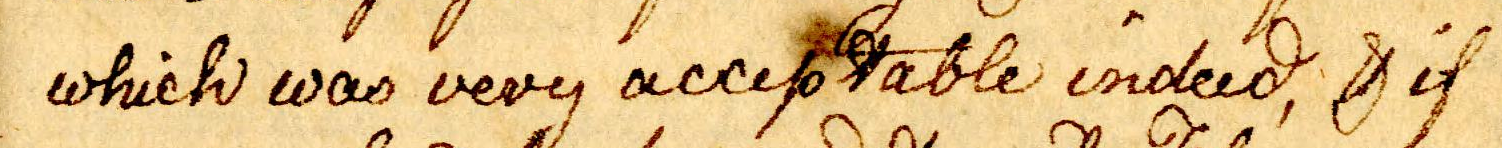which was very acceptable indeed, & if
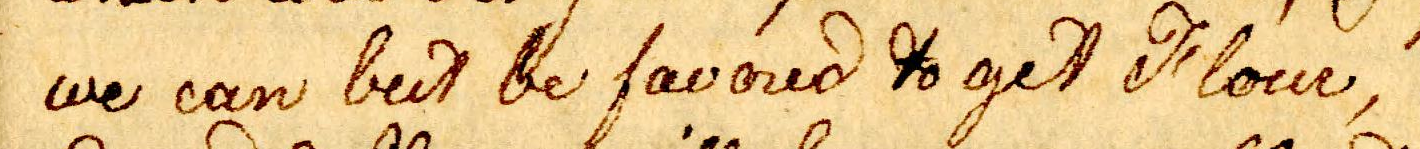we can but be favored to get Flour,
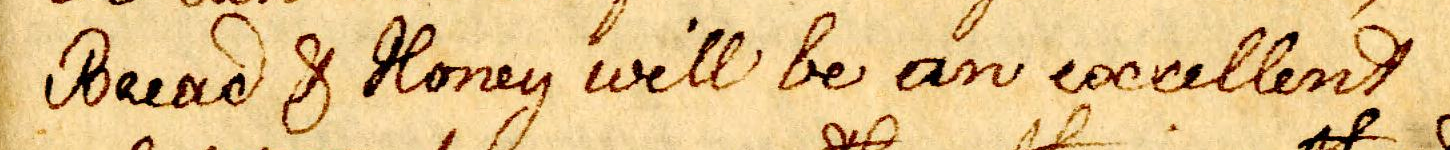Bread & Honey will be an excellent
